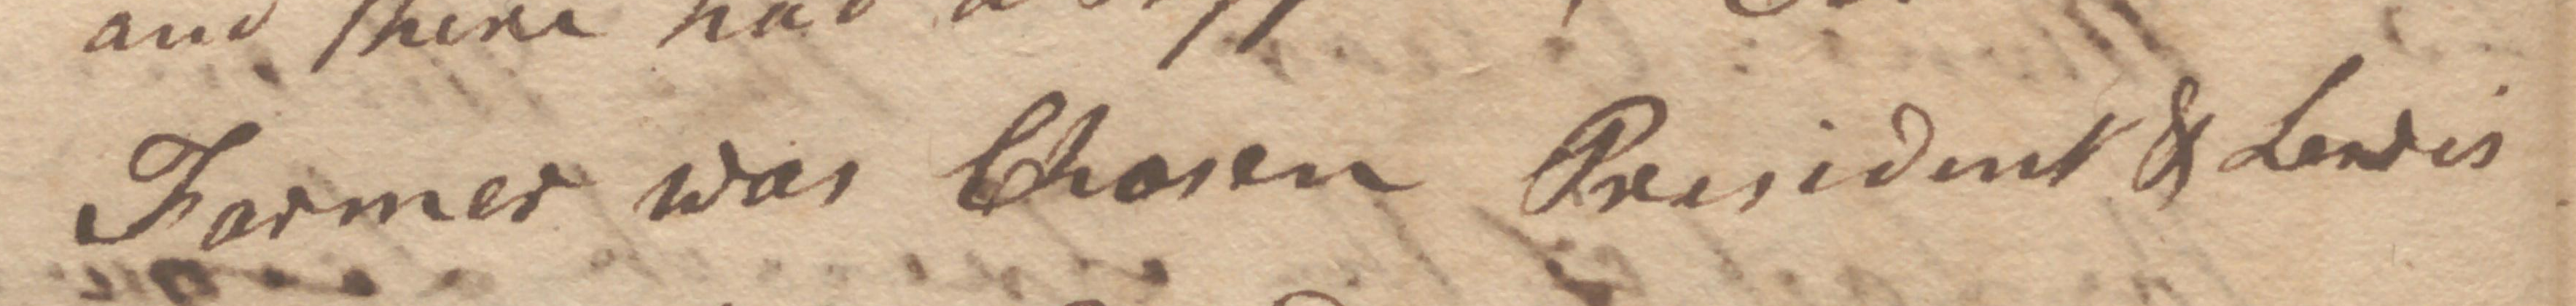Farmer was Chosen President & Lewis
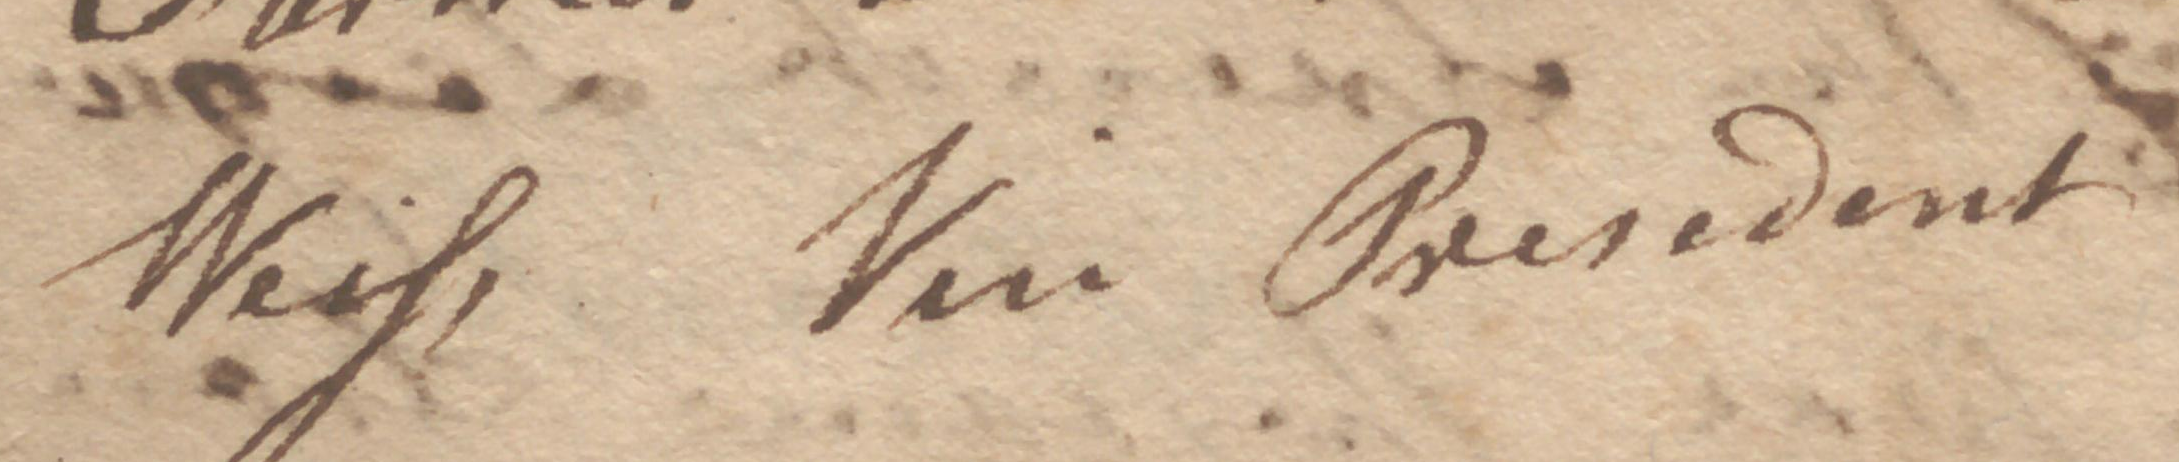Weiss Vice President
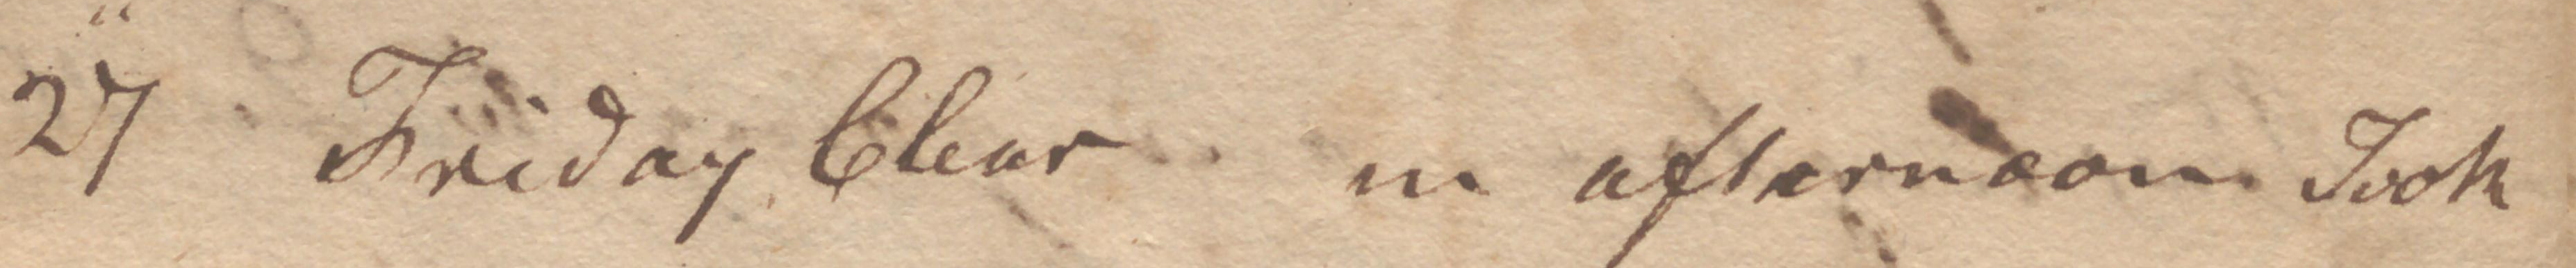27 Friday Clear in afternoon Took
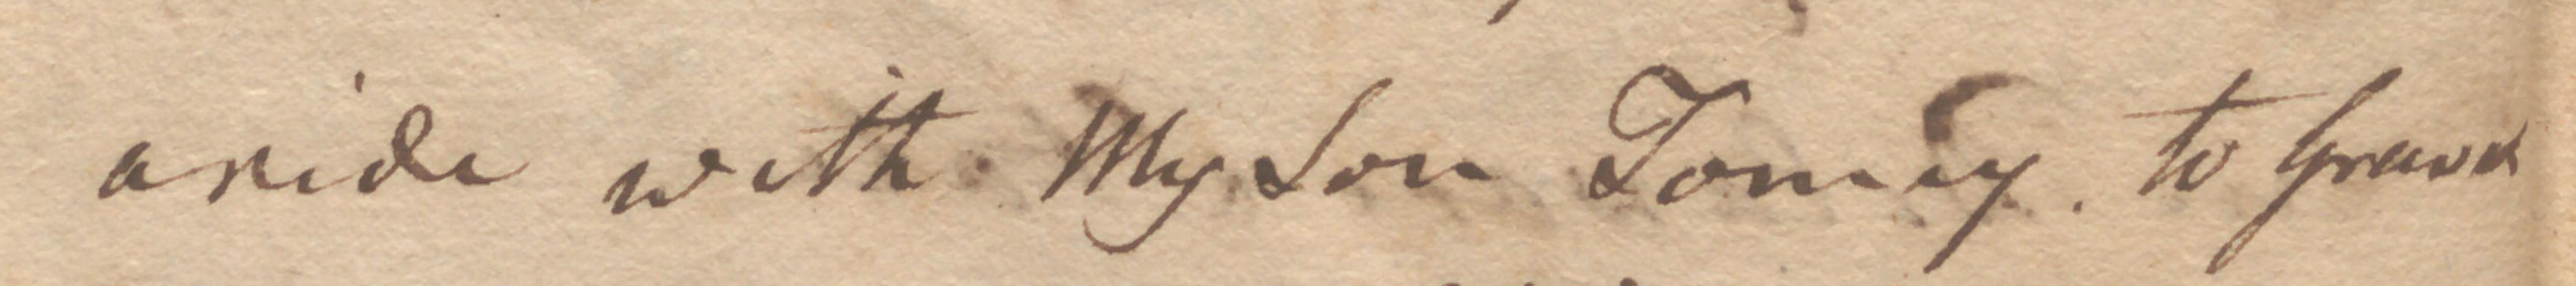a ride with My Son Tomey to Gravel
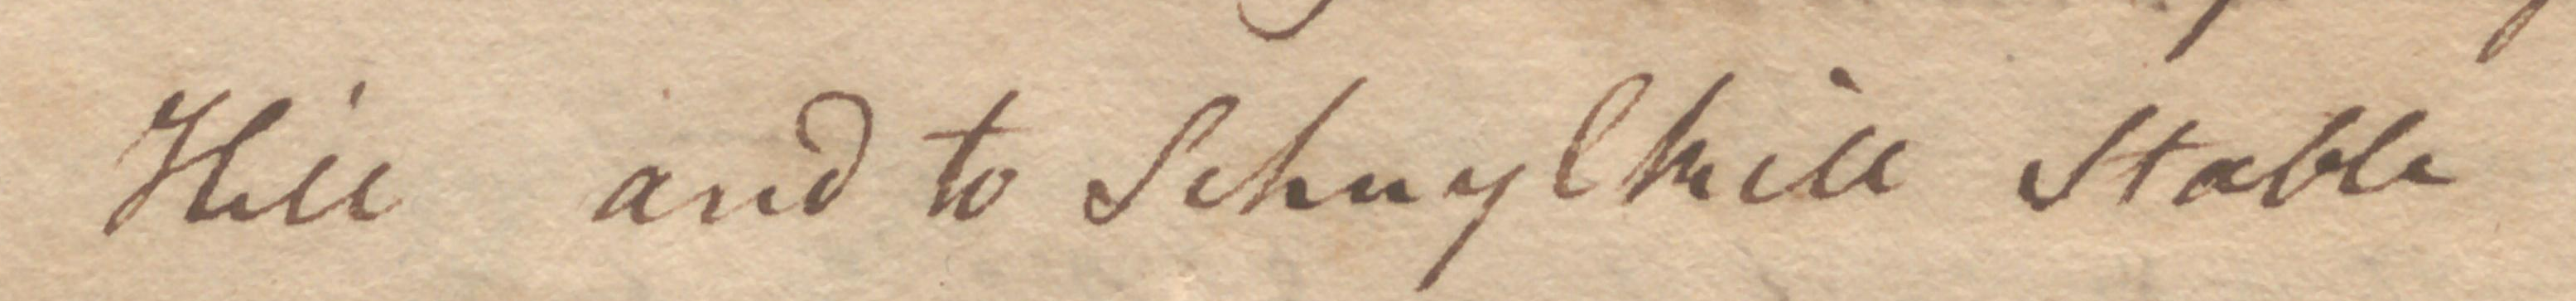Hill and to Schuylkill Stable
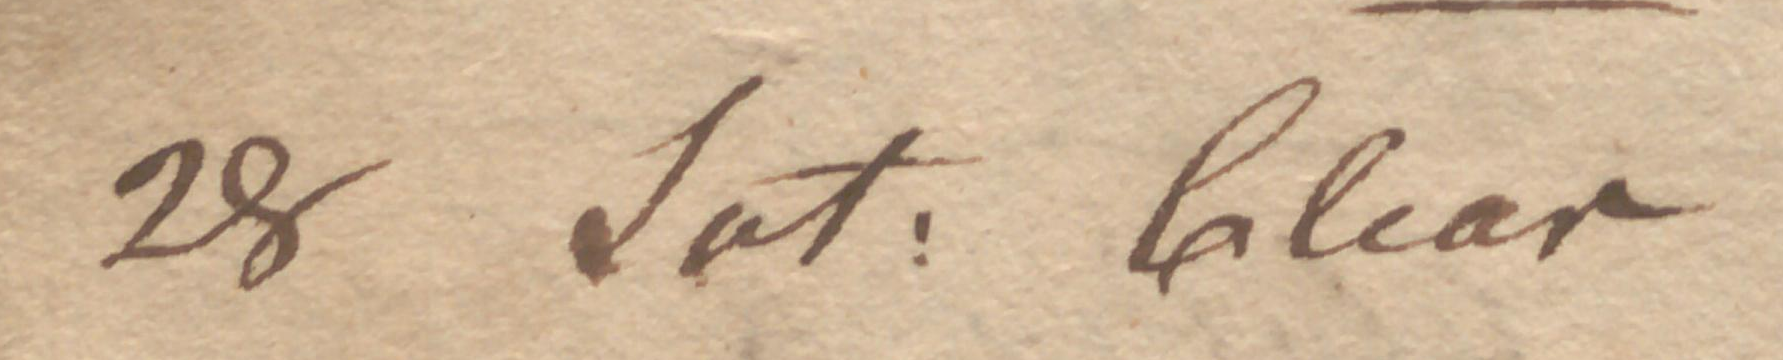28 Sat. Clear
